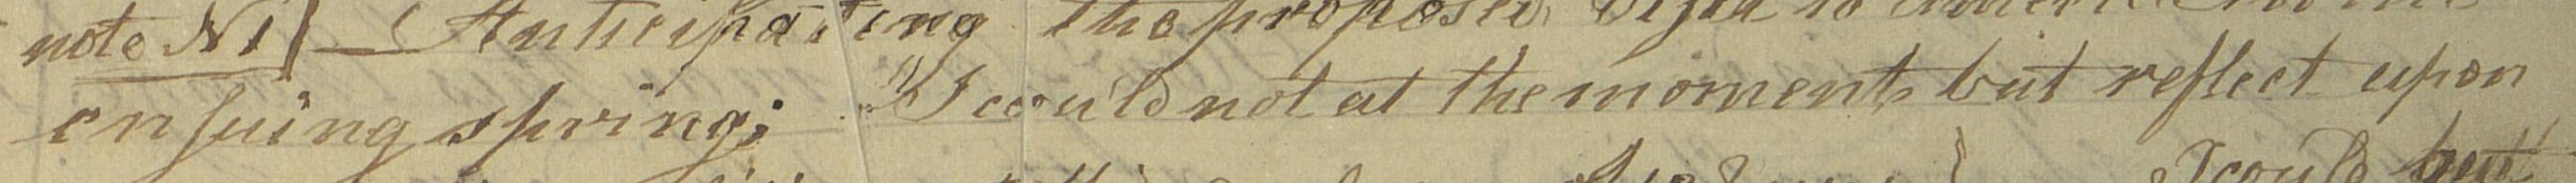ensuing spring; I could not at the moment but reflect upon
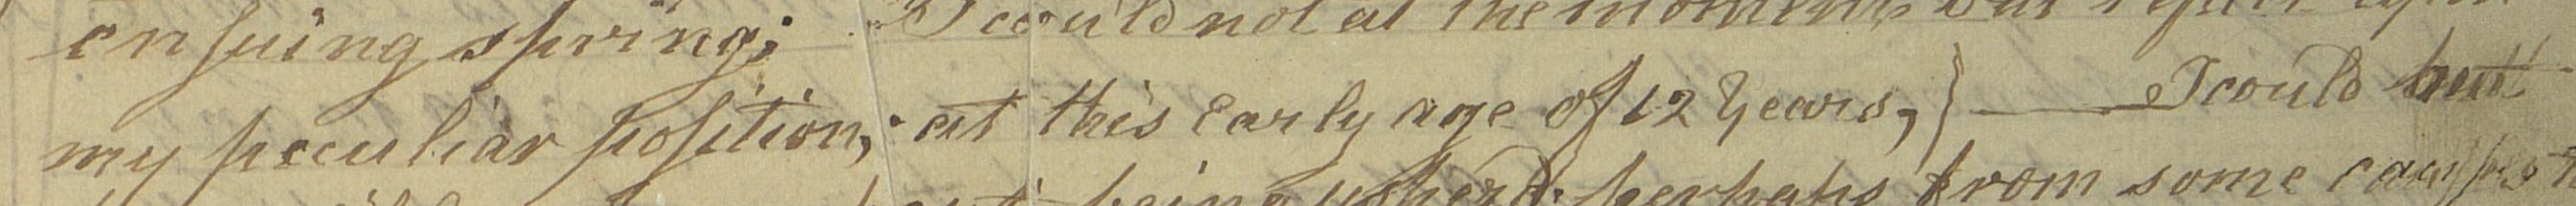my peculiar position; at this early age of 12 Years,) I could but
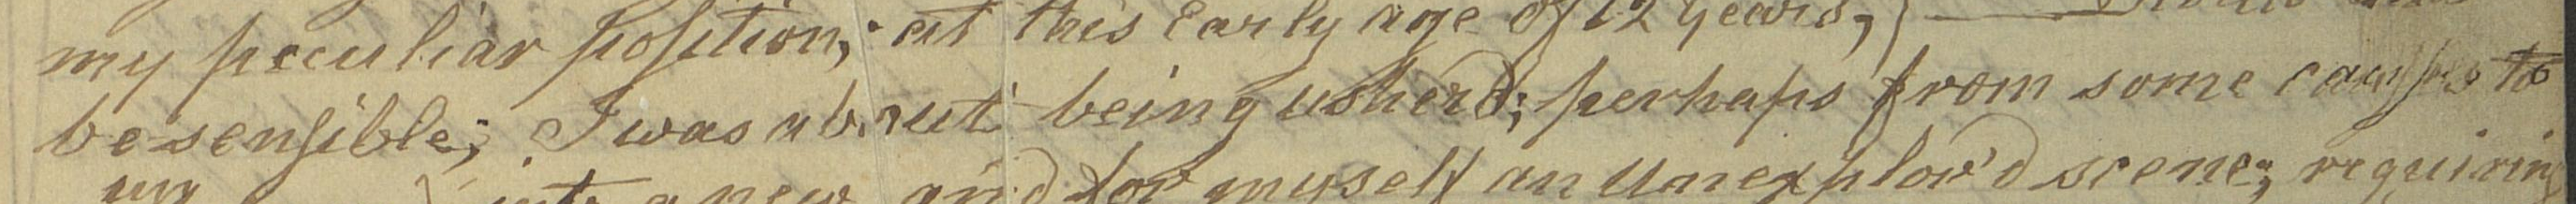be sensible; I was about being usherd; perhaps from some cause to
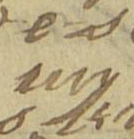un-
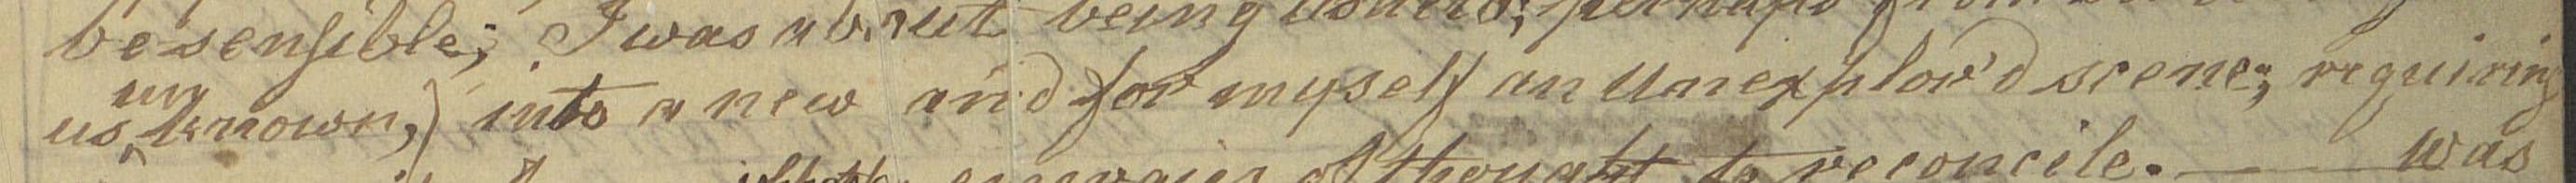us ^ known,) into a new and for myself in unexplor'd scene; requiring
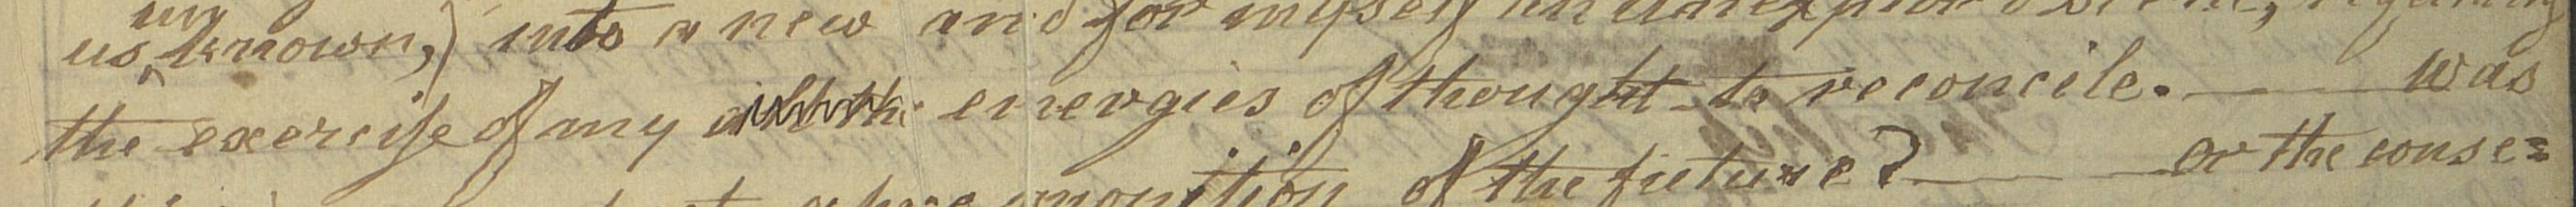tho exercise of my [___]th energies of thought to reconcile. Was
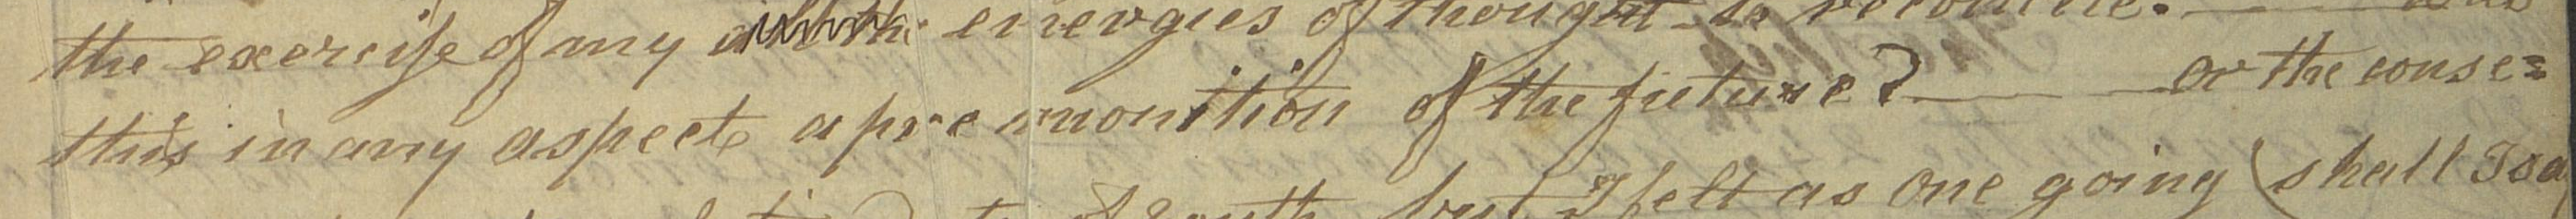this in any aspect a premonition of the future? At the conse-
